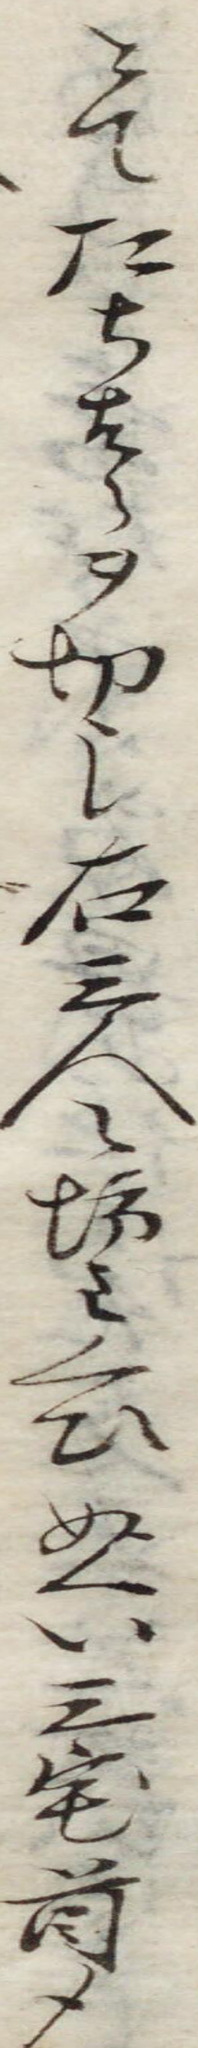とてたちはらを切申候右三人之坊主くひぬくい三宅首〆
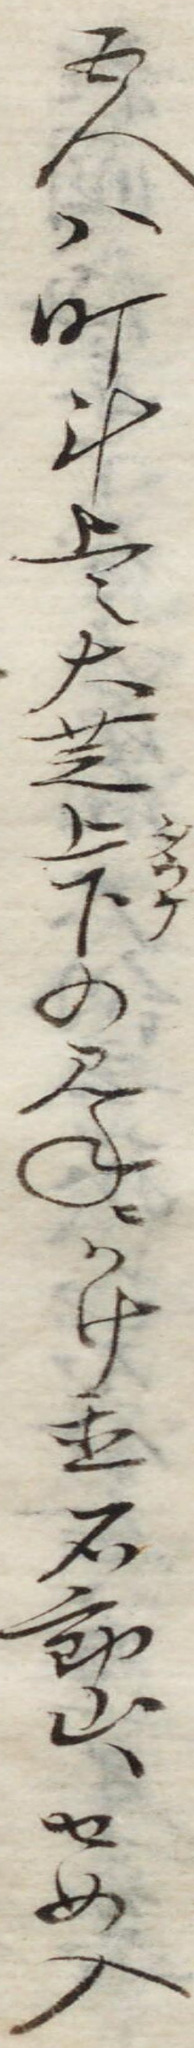五人は町斗上之大芝上下のみねにかけ置石動山へせめ入
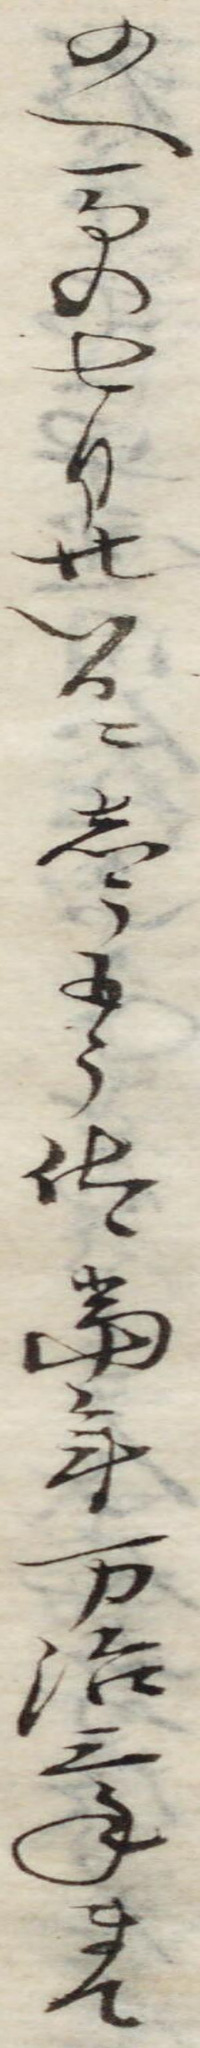のへ馬の七月廿八日にしうもう仕候当年万治三年まて
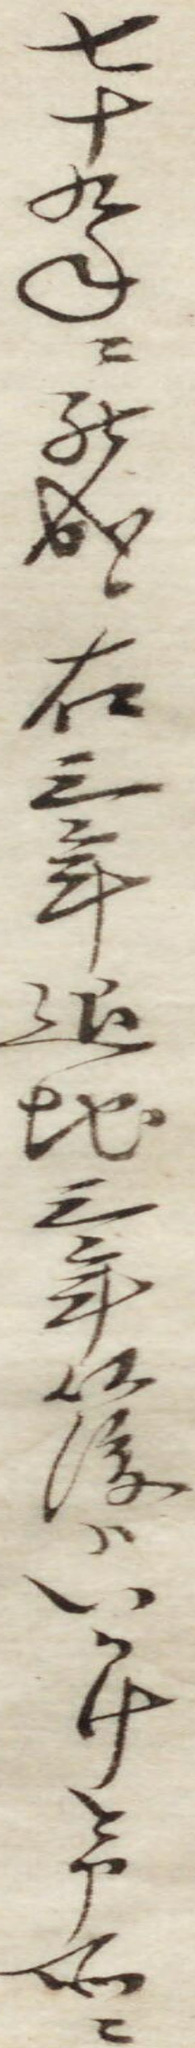七十九年に罷成候右三年退地以後はいかけと申所に
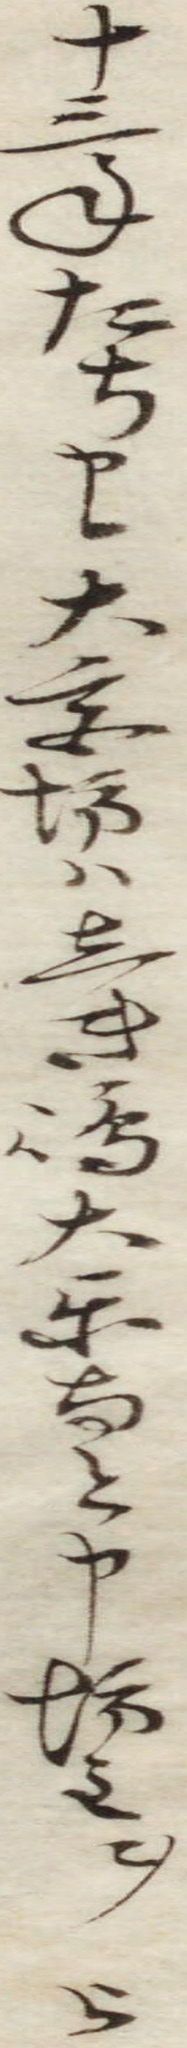十三年たち申候大宮坊はしき嶋大東南と申坊主を被
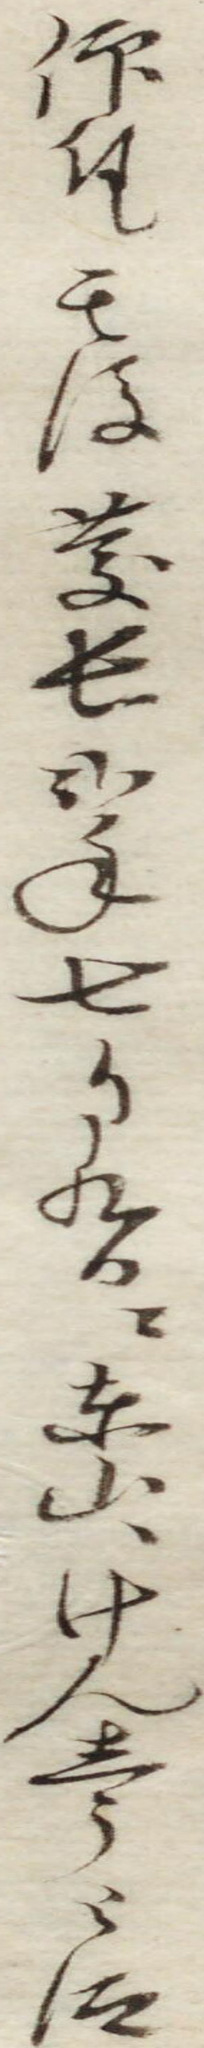仰付候其後慶長弐年七月九日に東山へけんしう被仰
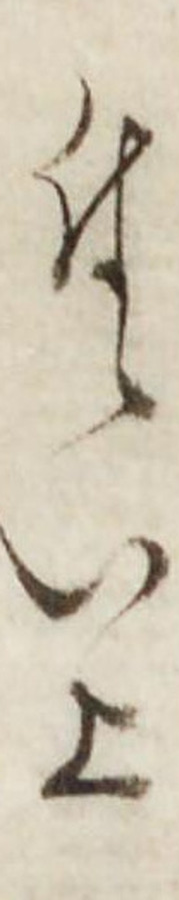付候以上
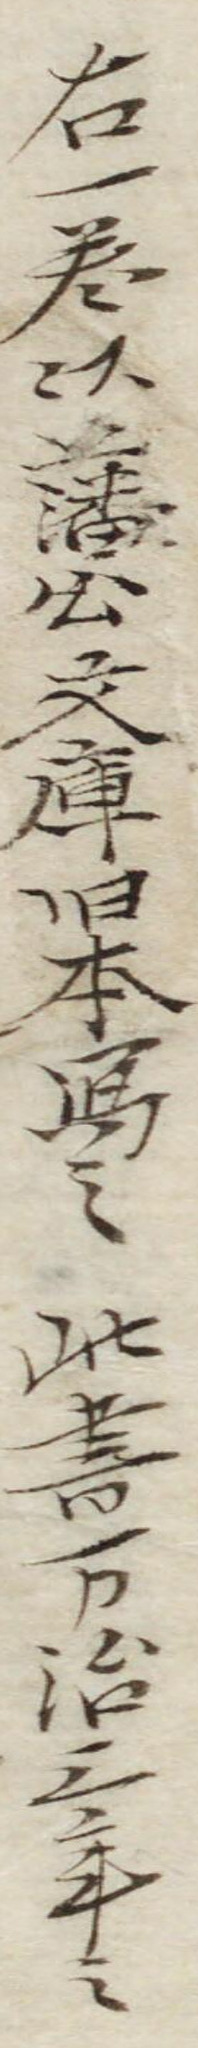右一巻以藩公文庫旧本写之此書万治三年之
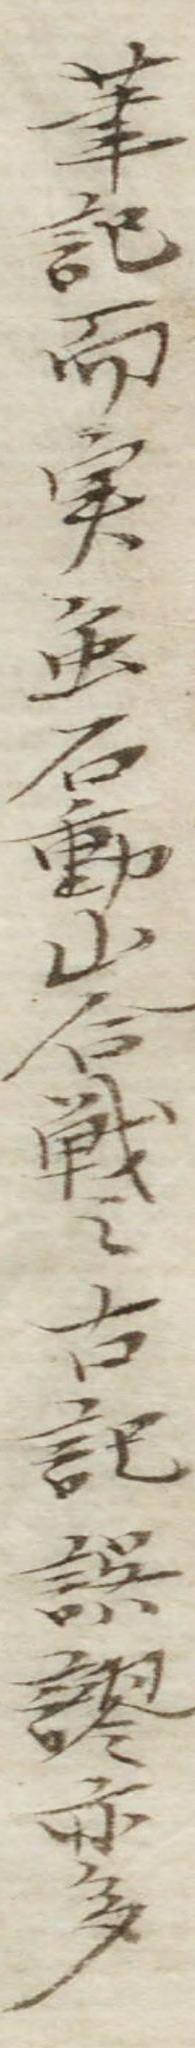茟記而実虽石動山合戦之古記誤謬亦多
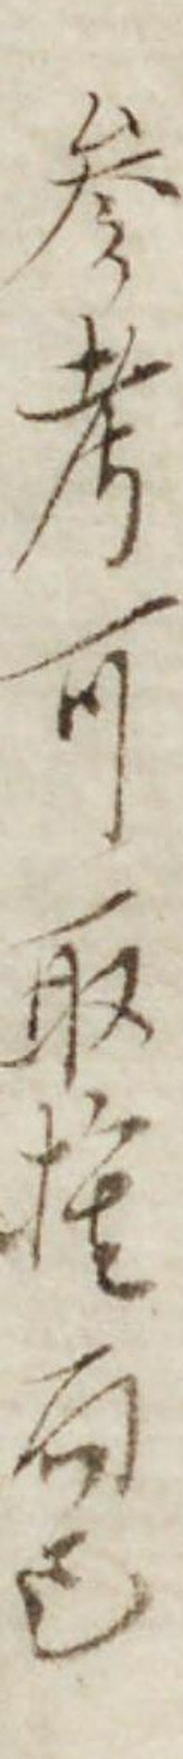参考可取捨而已

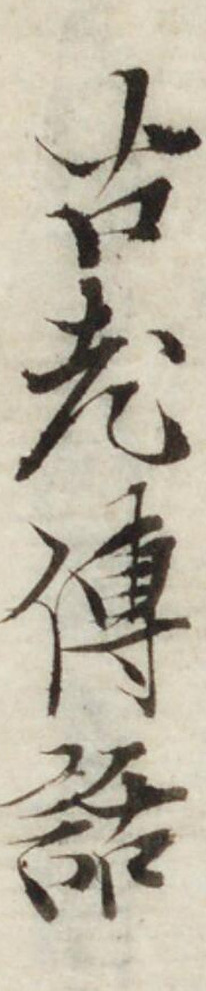古老伝話

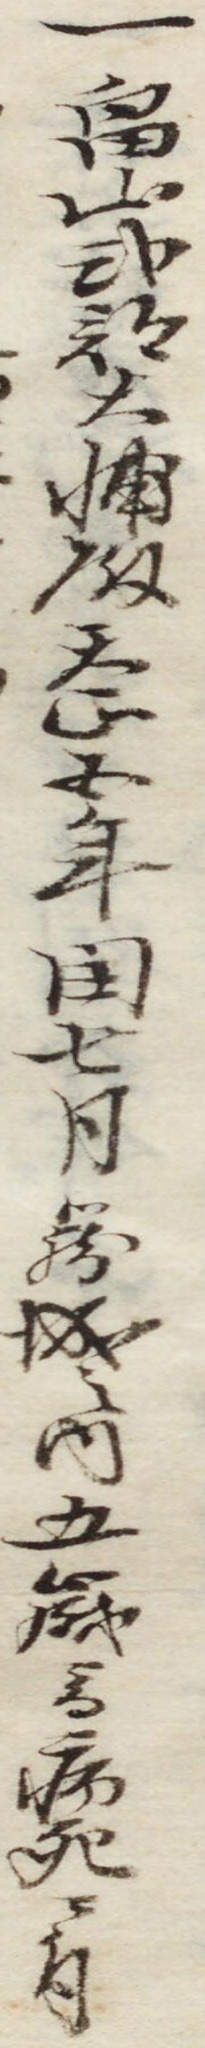一畠山式部大輔殿天正五年閏七月籠城之内五歳に而病死に付
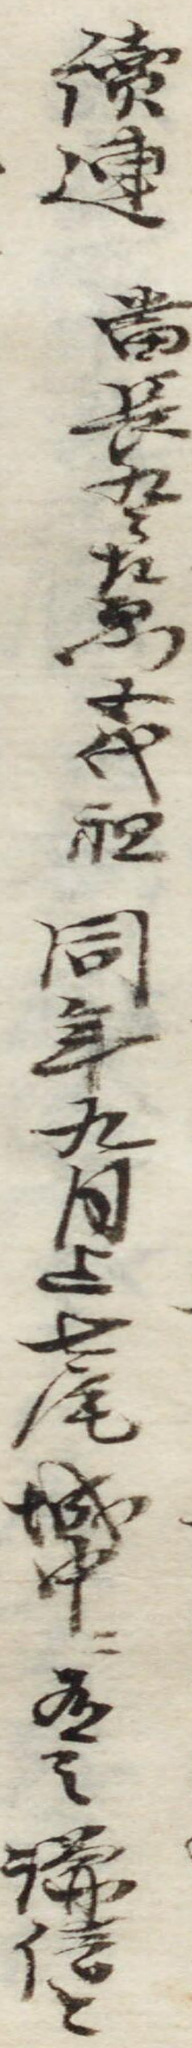続連当長九郎左衛門五代祖同年九月迄七尾城中に有之謙信と
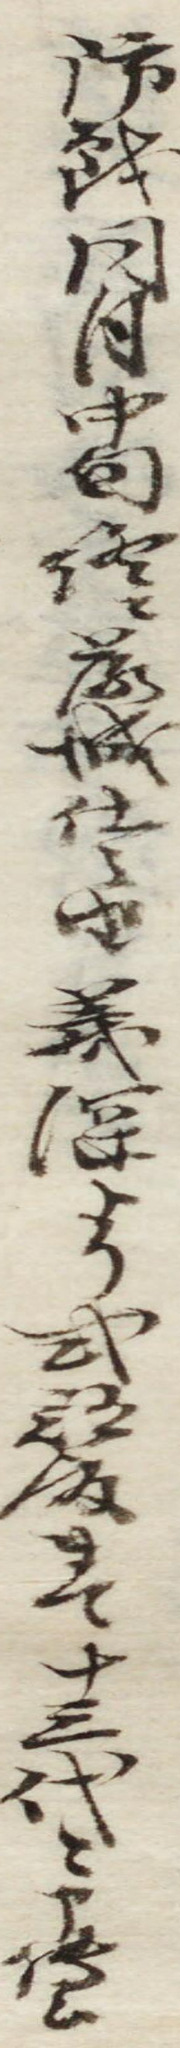防戦同月中旬終に落城仕之由義深より式部殿まて十三代と申伝候
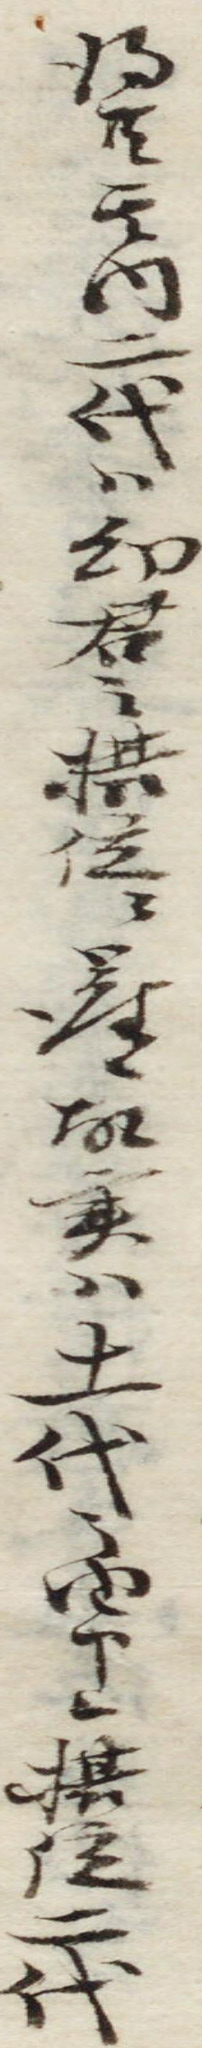得共其内二代は幼君之摂位に御座候故実は十一代之由申候摂位二代
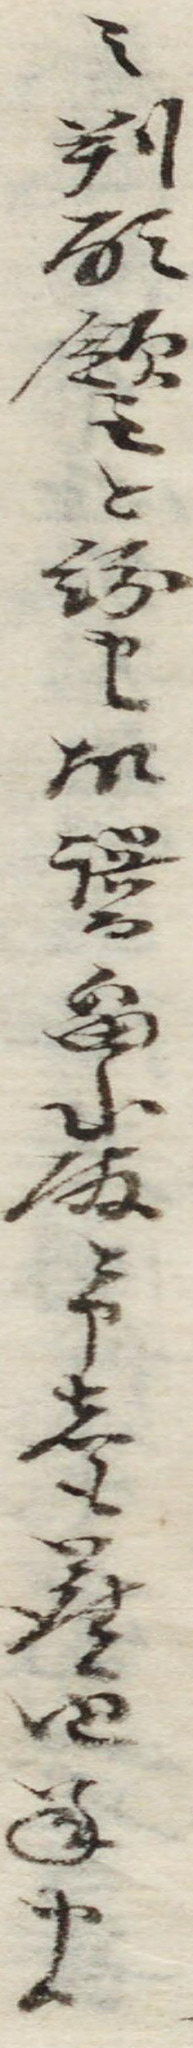之判形領主と紛申候故誤而畠山殿と申者も御座候由承申候
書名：古老紀談等
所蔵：Ishikawa Prefectural Library
